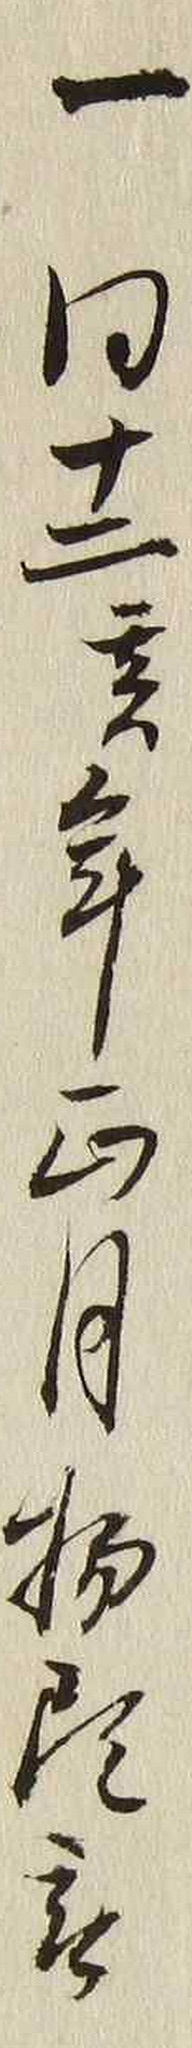一同十二亥年正月物頭被
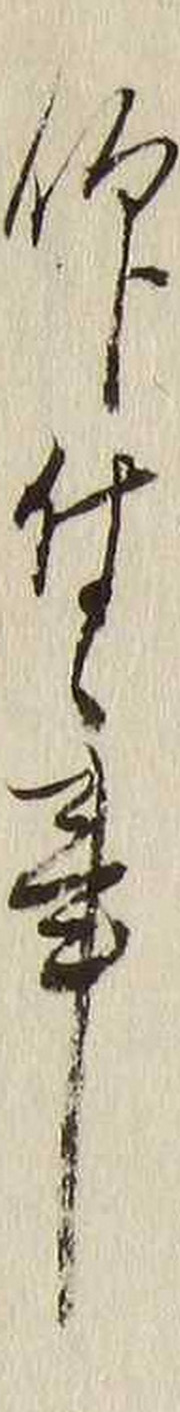仰付候事
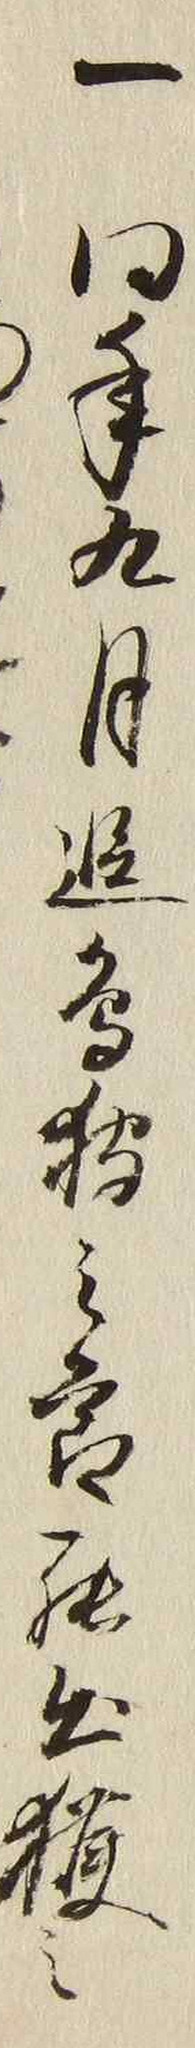一同年九月追鳥狩之節罷出獲之
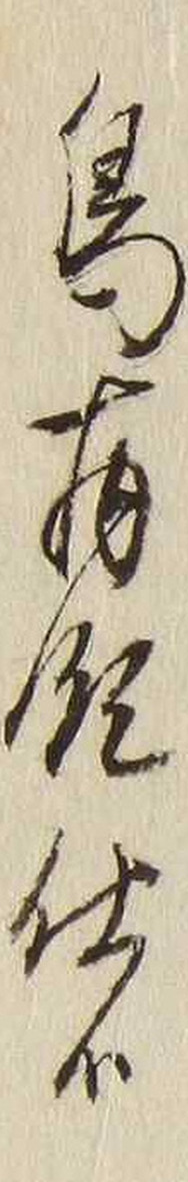鳥拝領仕候

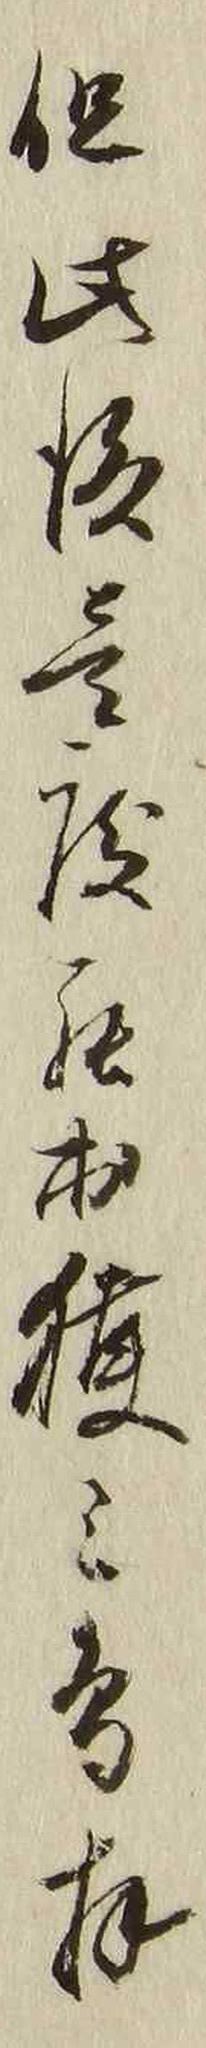但此後壱度罷出獲之鳥拝
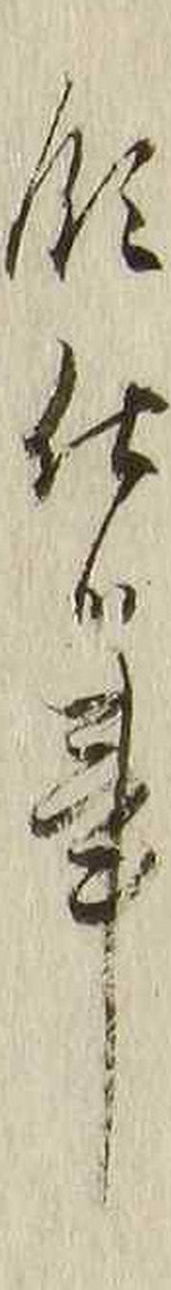領仕候事
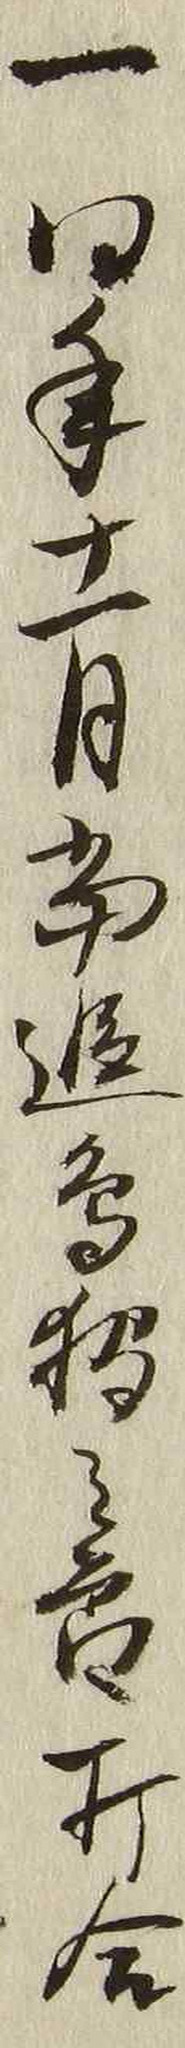一同年十一月当追鳥狩之節打合
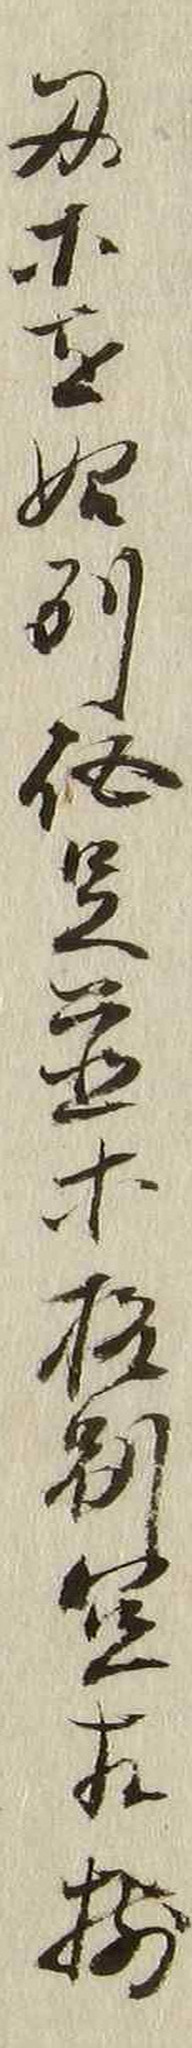刃等を始列伍足並等格別宜相揃
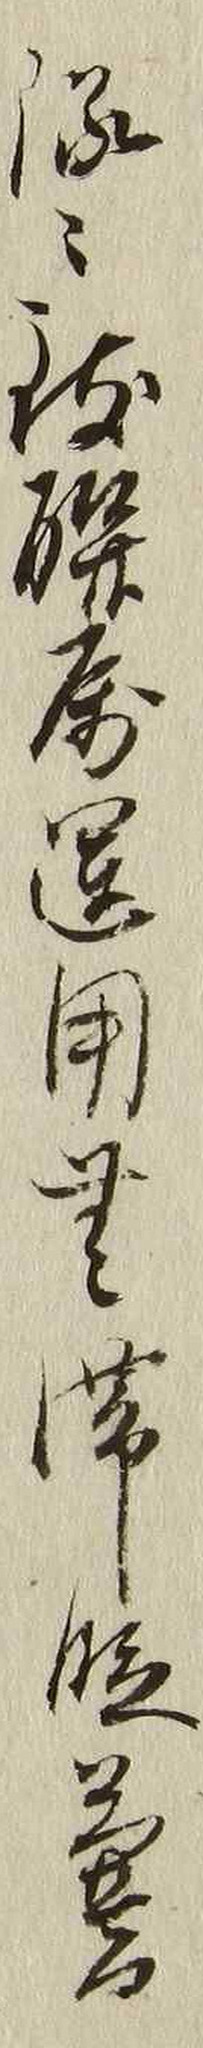隊々致聯属運用無滞段兼而
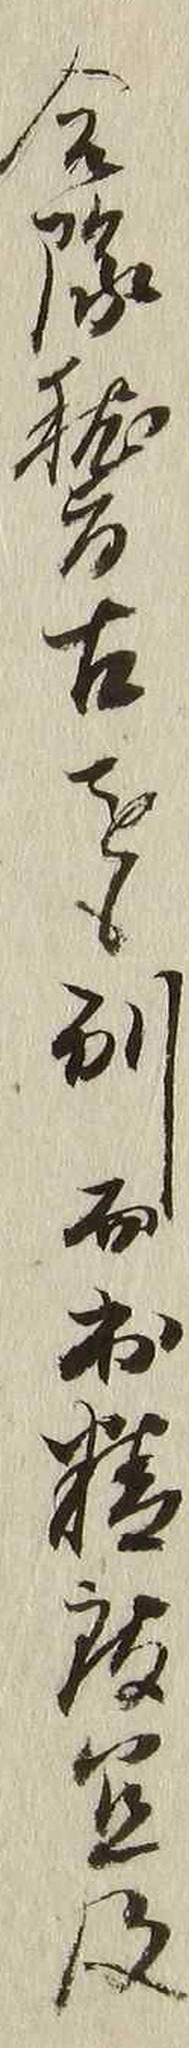合隊稽古をも別而出精致宜及
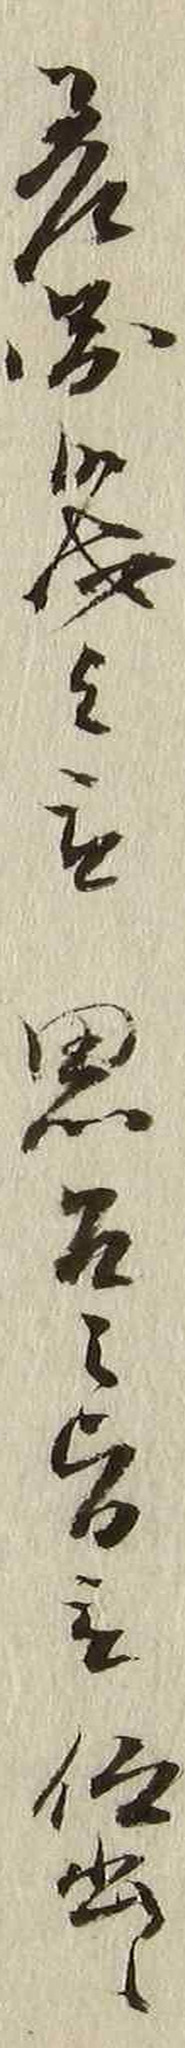差図候儀与被思召之旨被仰出候
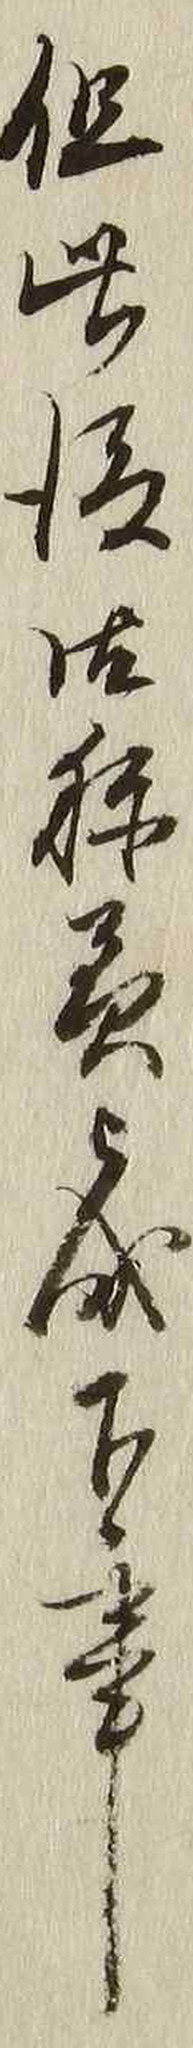但此後御称美被成下候事
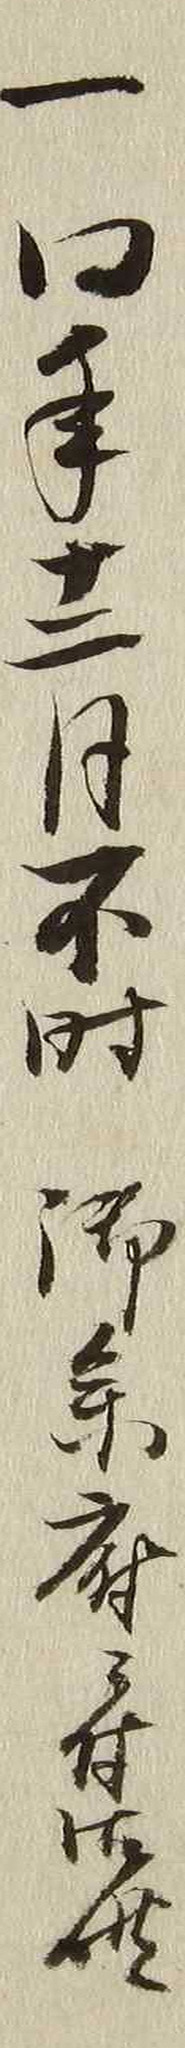一同年十二月不時御参府ニ付御供
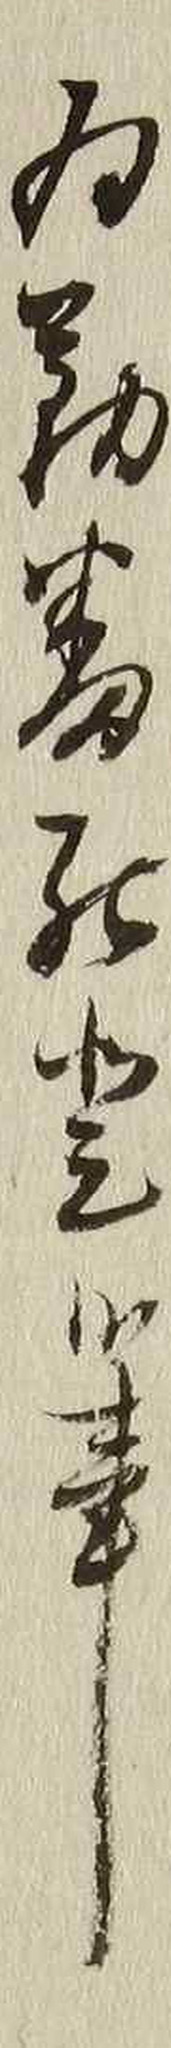為勤番罷登候事
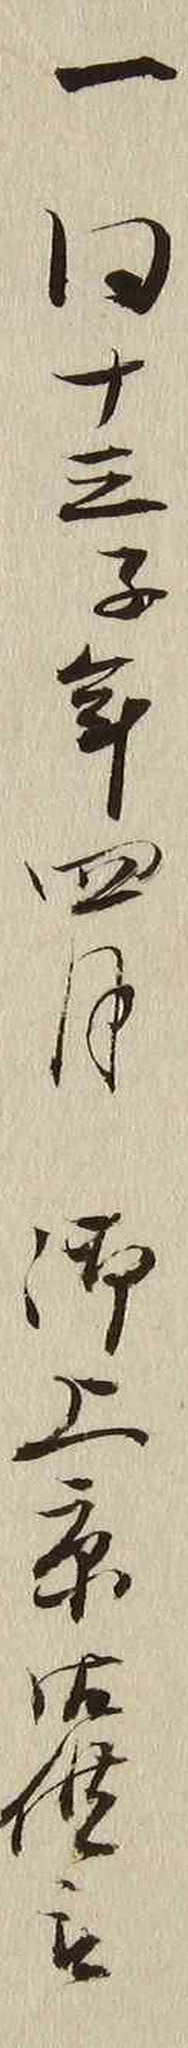一同十三子年四月御上京御供被
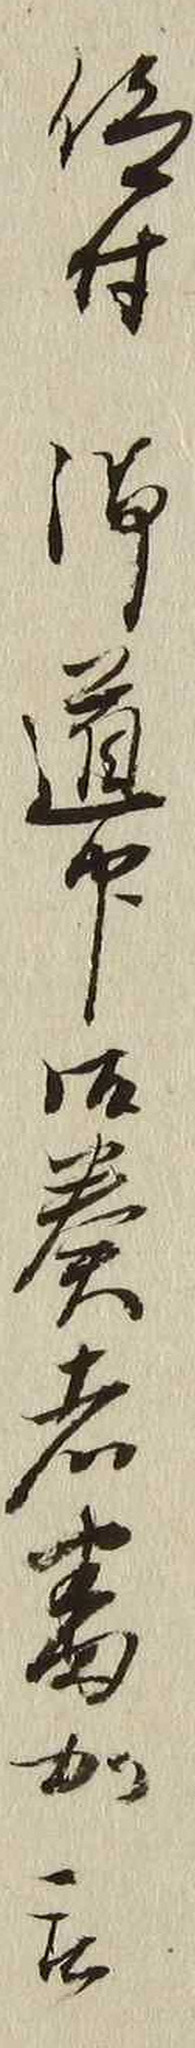仰付御道中御奏者番加被
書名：諸士系譜　巻之348　も之部4
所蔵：会津若松市立会津図書館
